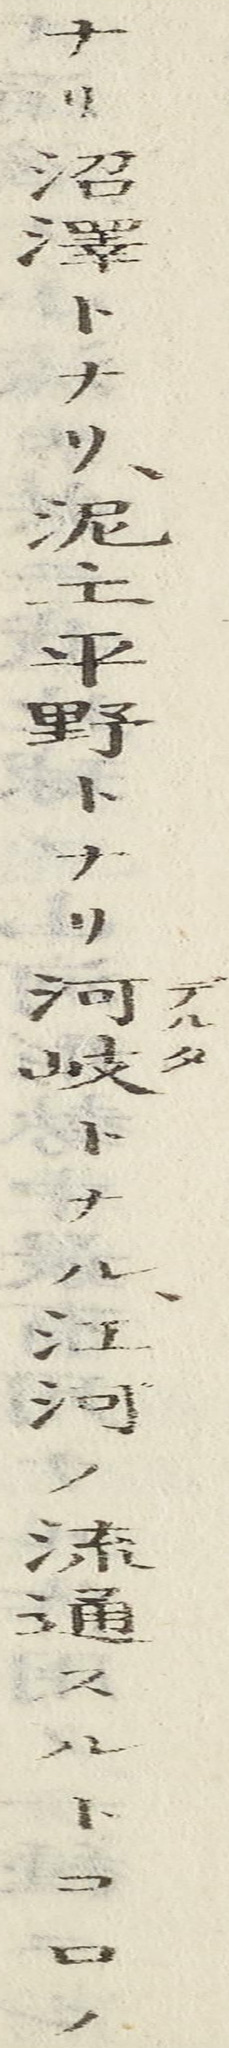ナリ沼沢トナリ、泥土平野トナリ河岐トナル、江河ノ流通スルトコロノ
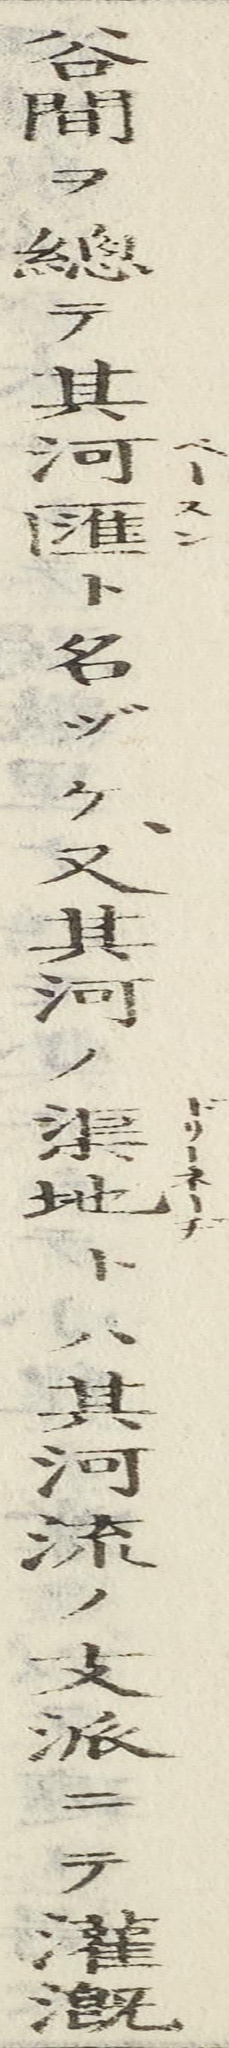谷間ヲ総テ其河匯ト名ヅク、又其河ノ渠地トハ其河流ノ支派ニテ灌漑
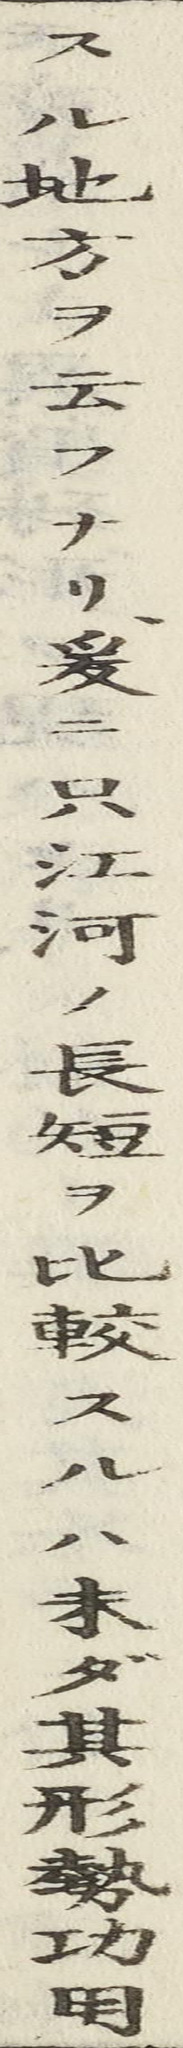スル地方ヲ云フナリ、爰ニ只江河ノ長短ヲ比較スルハ未ダ其形勢功用
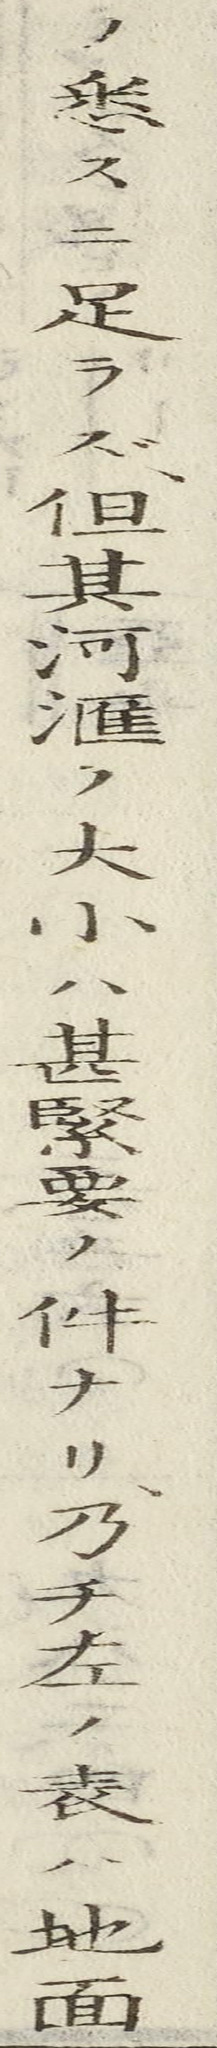ノ悉スニ足ラズ、但其河匯ノ大小ハ其緊要ノ件ナリ、乃チ左ノ表ハ地面
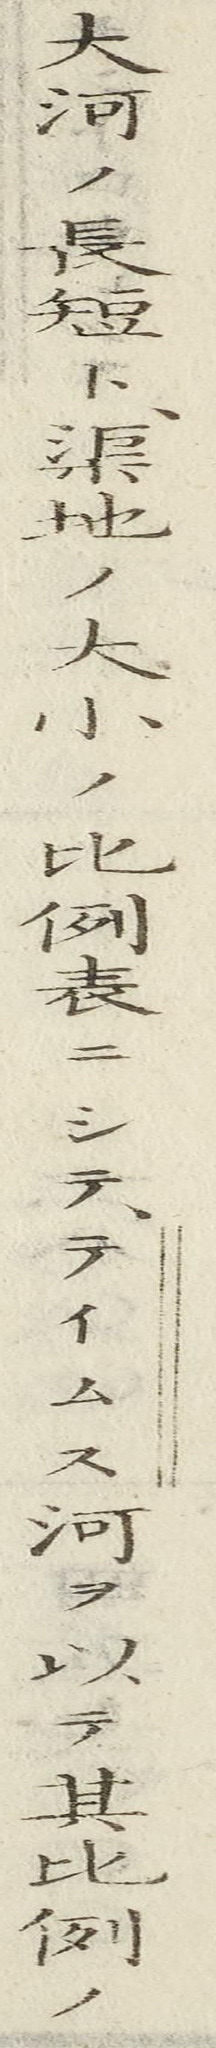大河ノ長短ト、渠地ノ大小ノ比例表ニシテ、テイムス河ヲ以テ其比例ノ
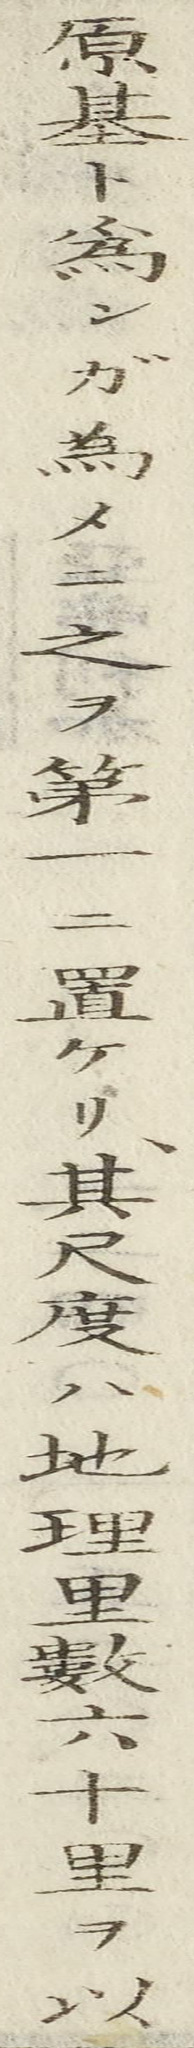原基ト為シガ為メニ之ヲ第一ニ置ケリ、其尺度ハ地理里数六十里ヲ以
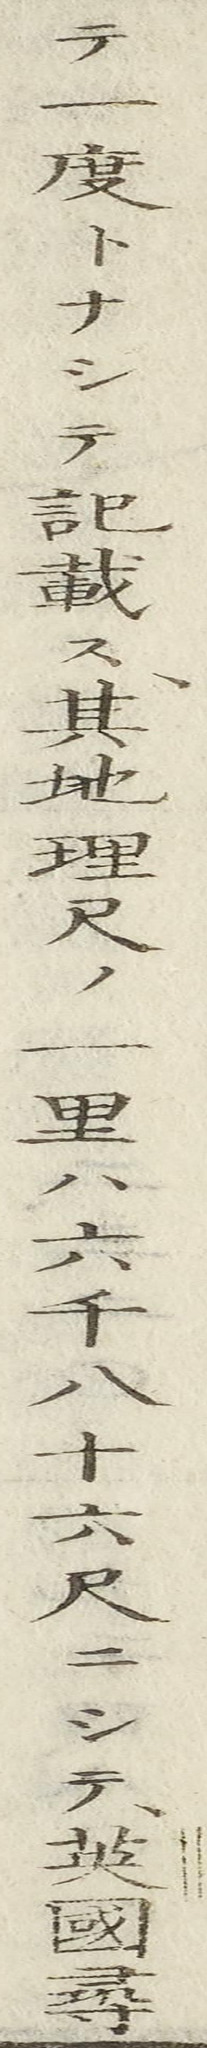テ一度トナシテ記載ス、其地理尺ノ一里ハ六千八十六尺ニシテ、英国尋
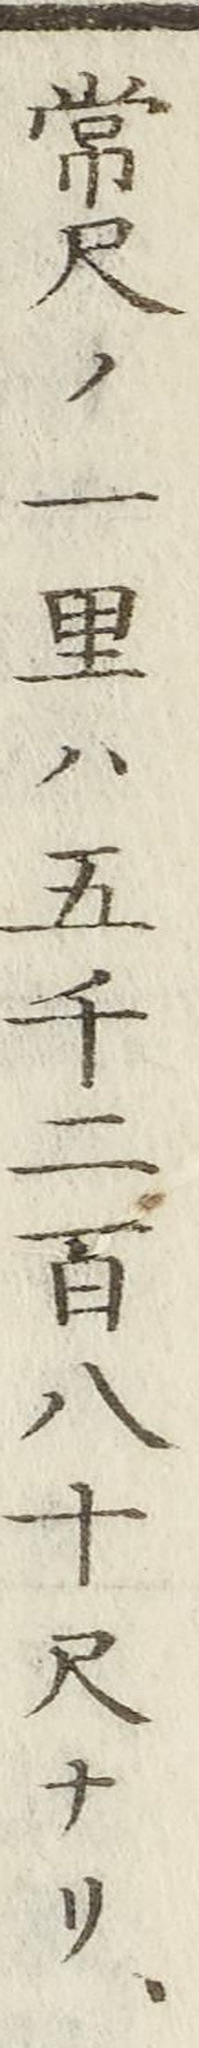常尺ノ一里ハ五千二百八十尺ナリ、

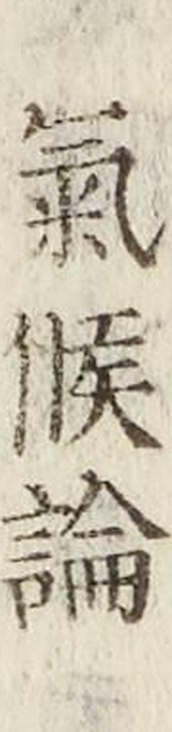気候論
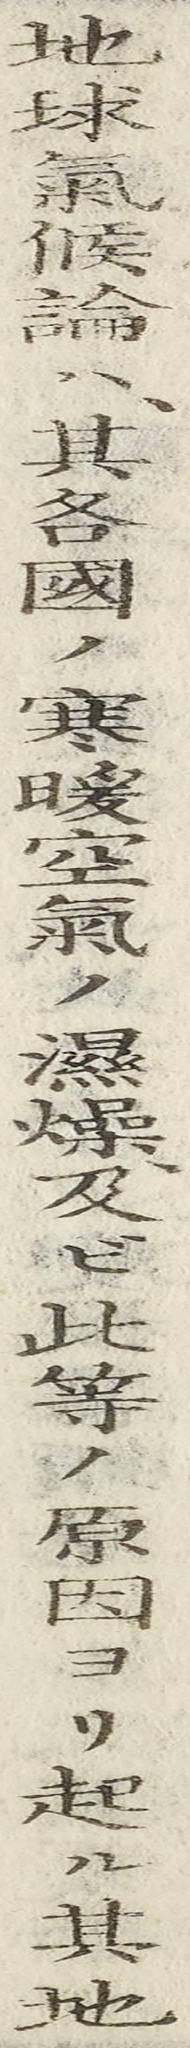地球気候論ハ、其各国ノ寒暖空気ノ湿燥、及ビ此等ノ原因ヨリ起ル其地
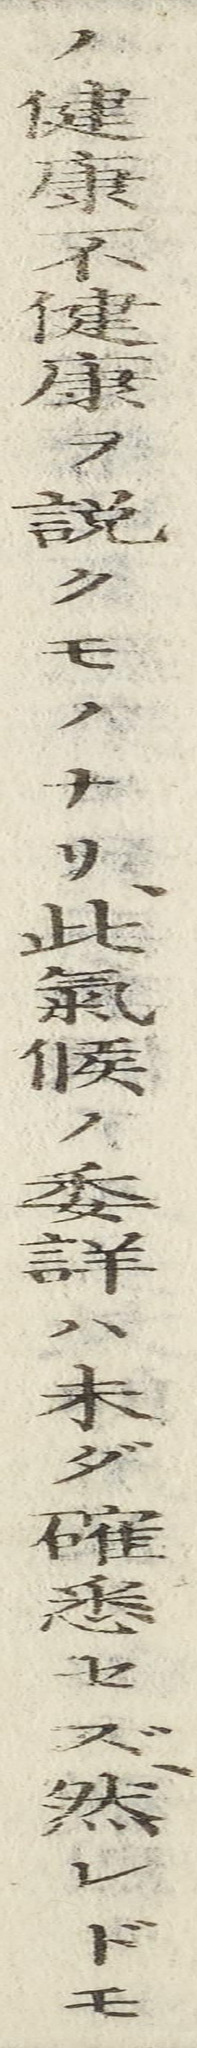ノ健康不健康ヲ説クモノナリ、此気候ノ委詳ハ未ダ確悉セズ、然レドモ
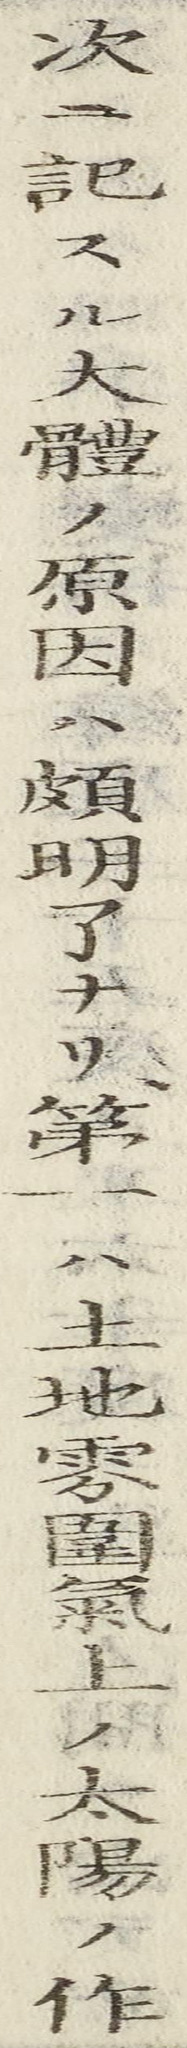次ニ記スル大体ノ原因ハ頗明了ナリ、第一ハ土地雰囲気上ノ太陽ノ作
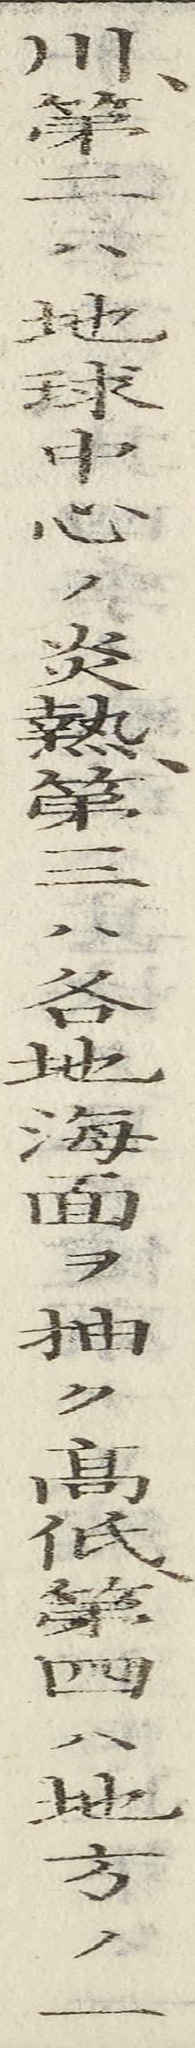用、第二ハ地球中心ノ炎熱、第三ハ各地海面ヲ抽ク高低、第四ハ地方ノ一
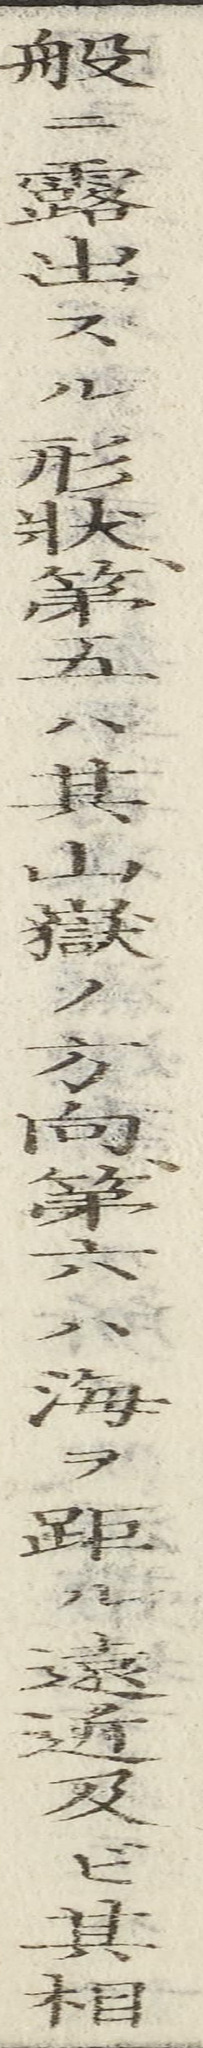般ニ露出スル形状、第五ハ其山嶽ノ方向、第六ハ海ヲ距ル遠近及ビ其相
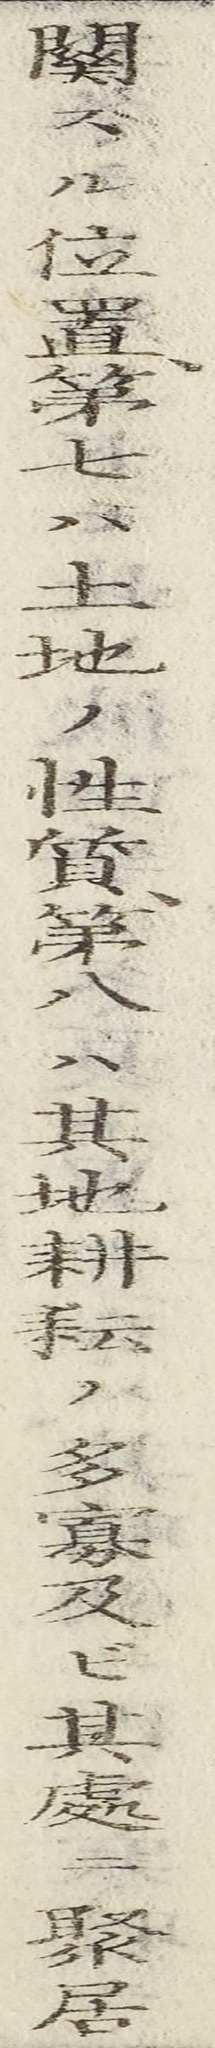関スル位置、第七ハ土地ノ性質、第八ハ其地耕耘ノ多寡及ビ其処ニ聚居
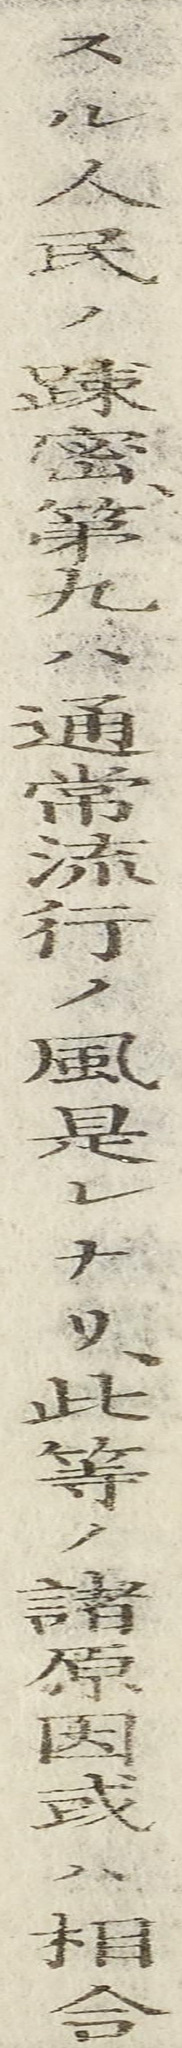スル人民ノ疎密、第九ハ通常流行ノ風是レナリ、此等ノ諸原因或ハ相合
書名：百科全書　地文學　全
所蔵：東京大学地震研究所図書室 Earthquake Research Institute Library, The University of Tokyo, JAPAN
